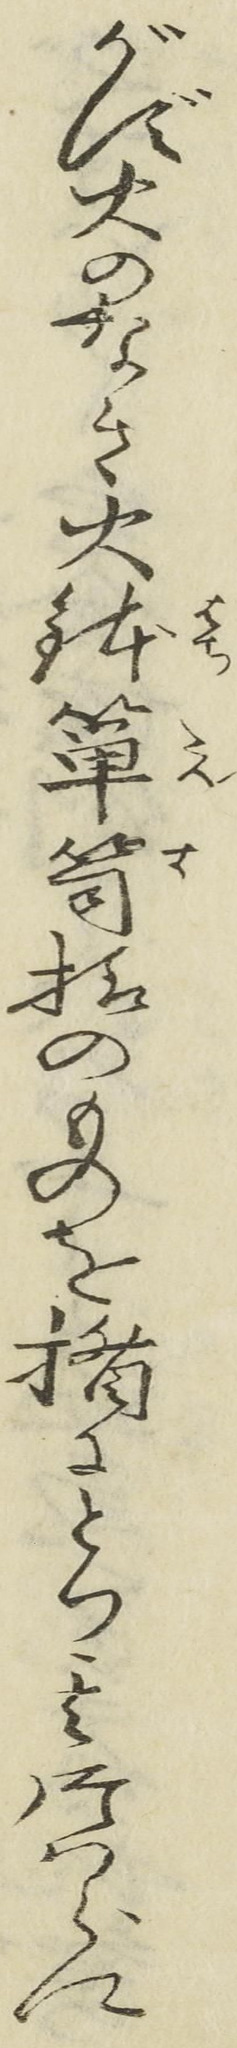がず火のなき火鉢箪笥様のものを楯にとり其片はらに
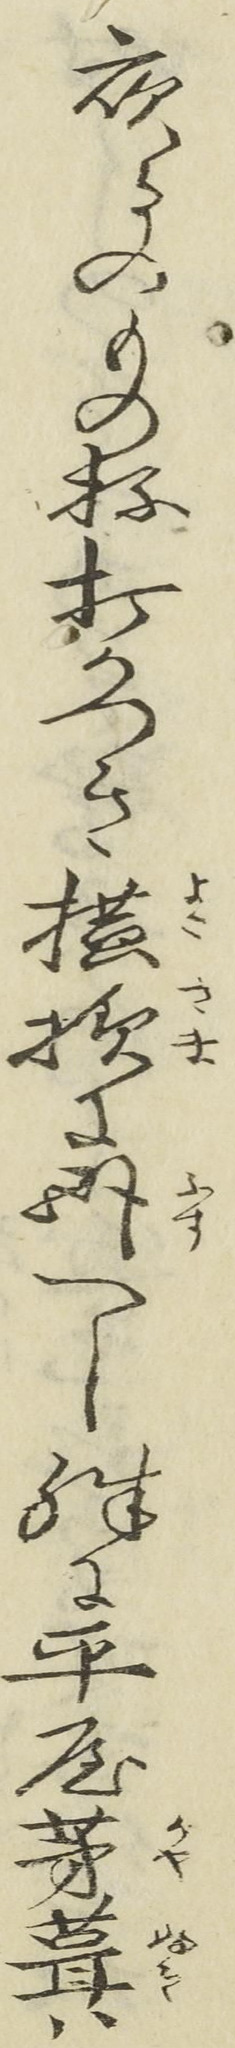夜るのもの等打かつき横様に臥へし躰に平屋茅葺は
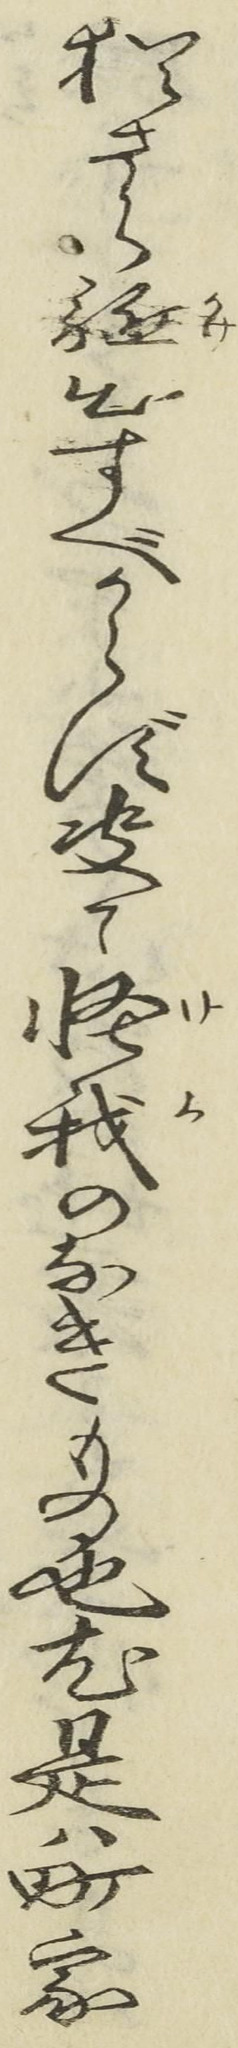猶さら駆出すべからず決て怪我のなきもの也尤是は町家
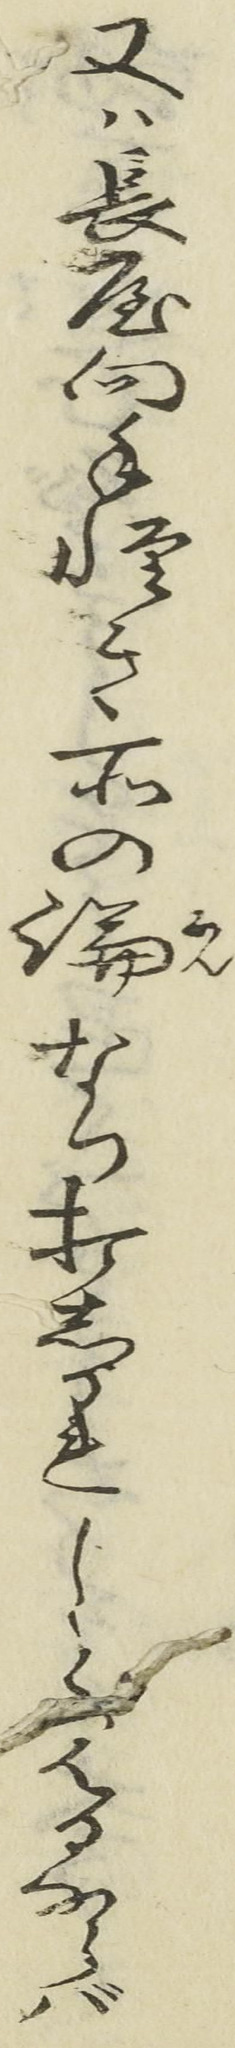又は長屋向手軽き所の論なら打しかれしと？見るならば
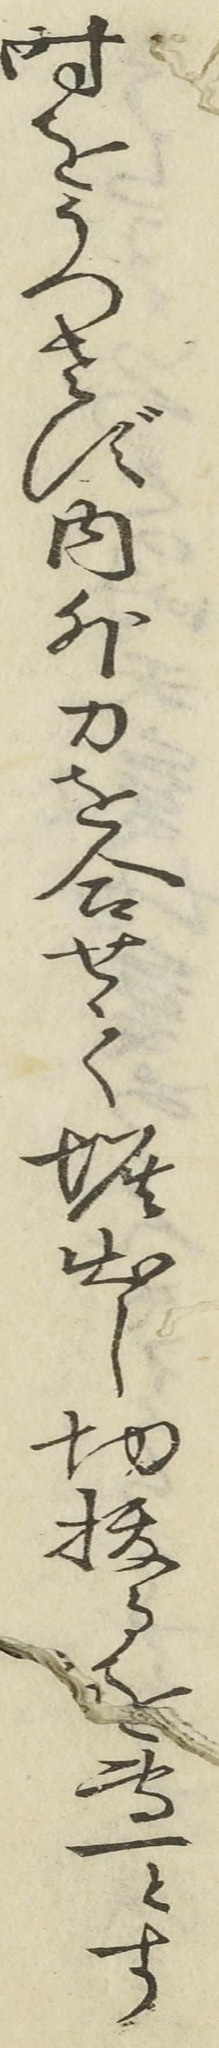時をうつさず内外力を合せて掘出し切り抜るを第一とす
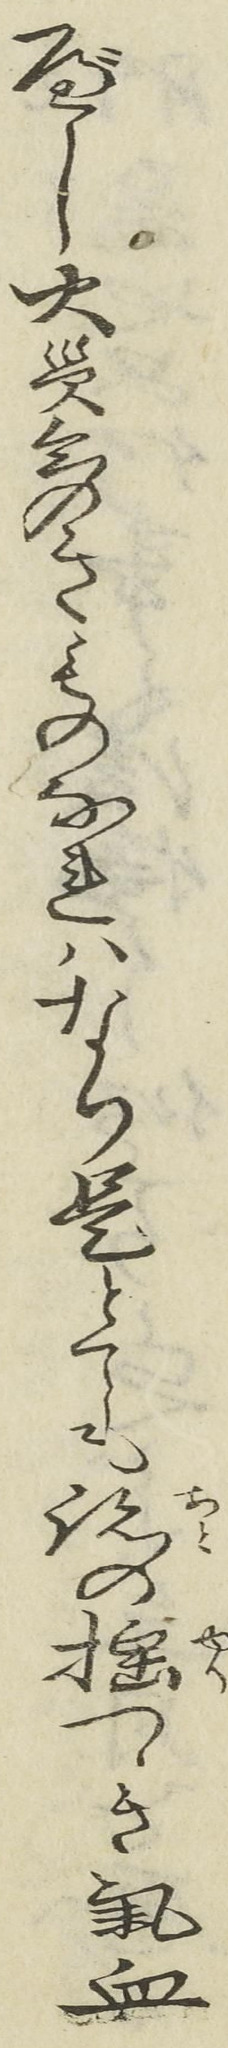べし火災おおきものなれはなり是とても跡の揺つゝき気血
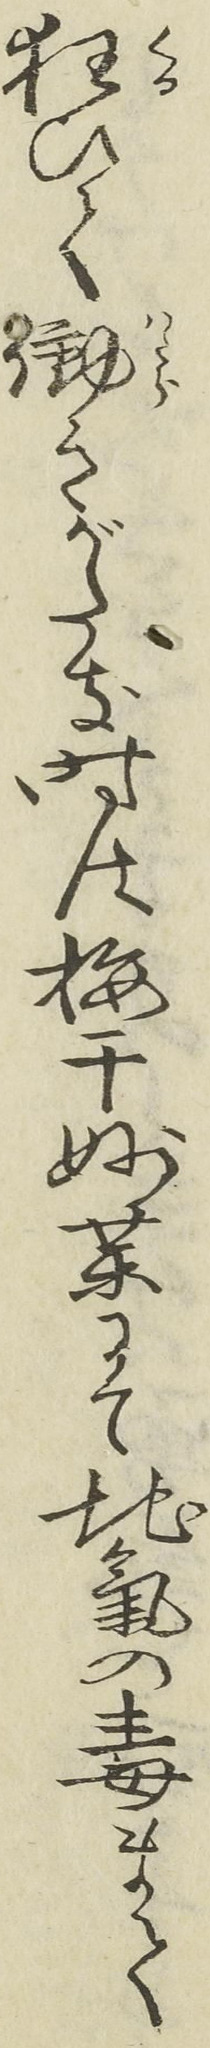狂ひて働きがたき時は梅干妙菜にて地気の毒まて
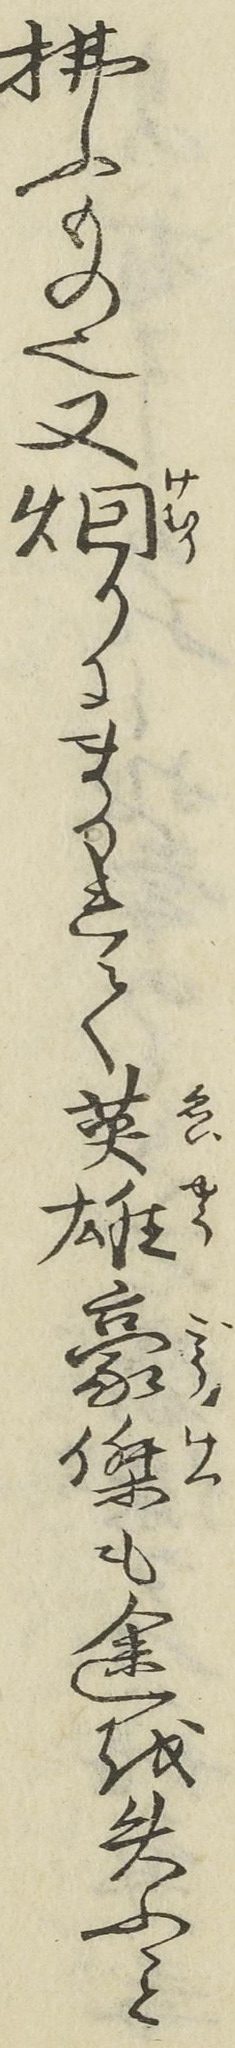拂ふもの也又煙りにまかれて英雄豪傑も途を失ふこと
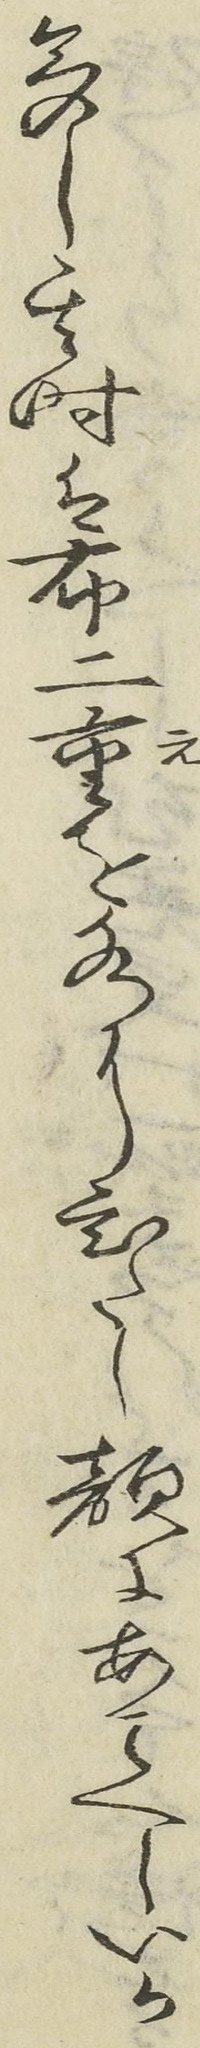多し其時は布二重を水にひたし顔にあてへしいか
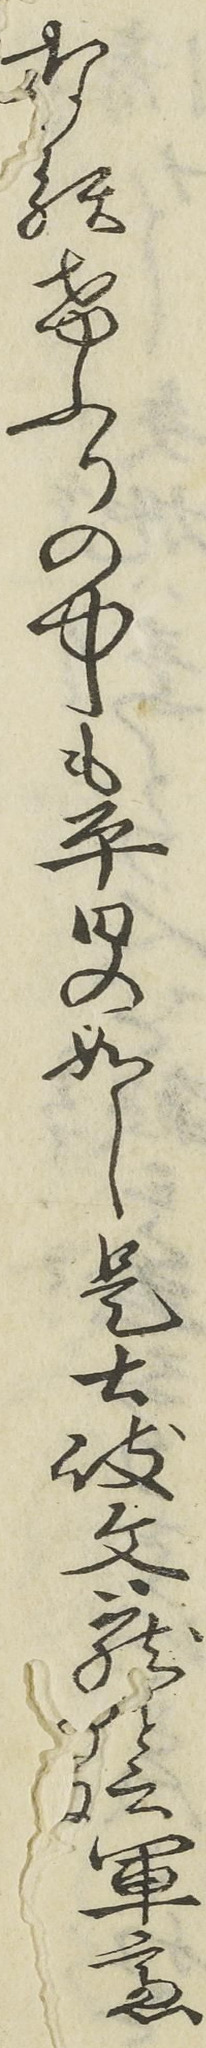なるけふりの中も平日の如し是土伎文蔵と云軍慮
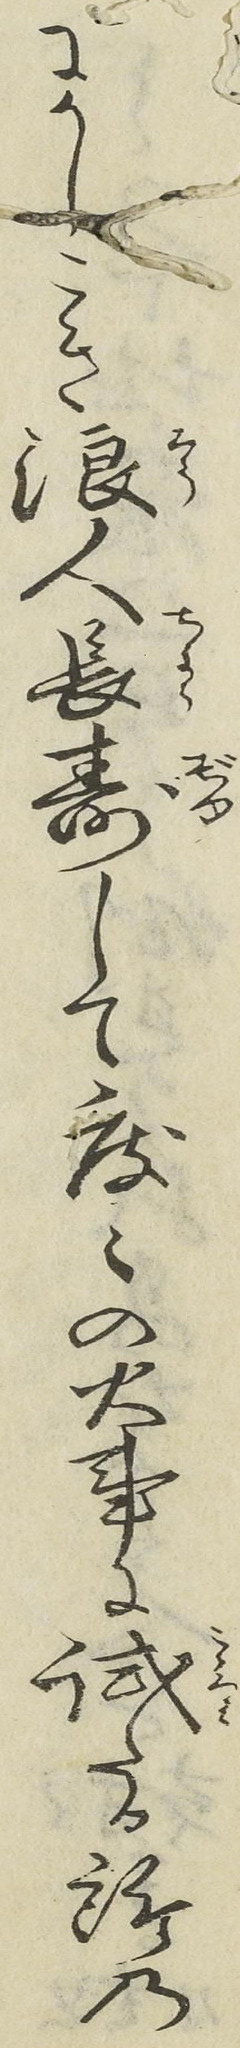にかしこき浪人長寿して度々の火事に試みたる所の
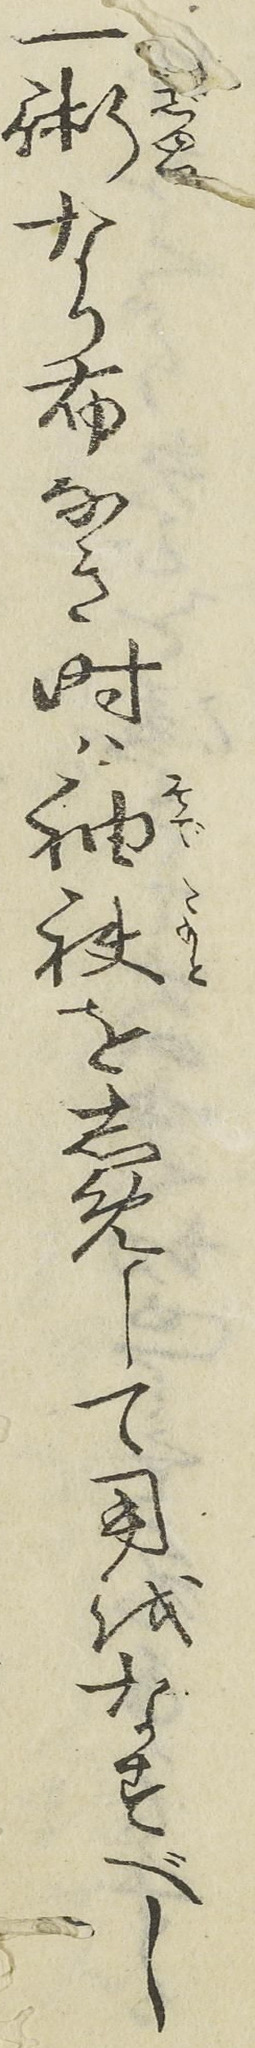一術なり布なき時は袖袂をしめして用をなすべし
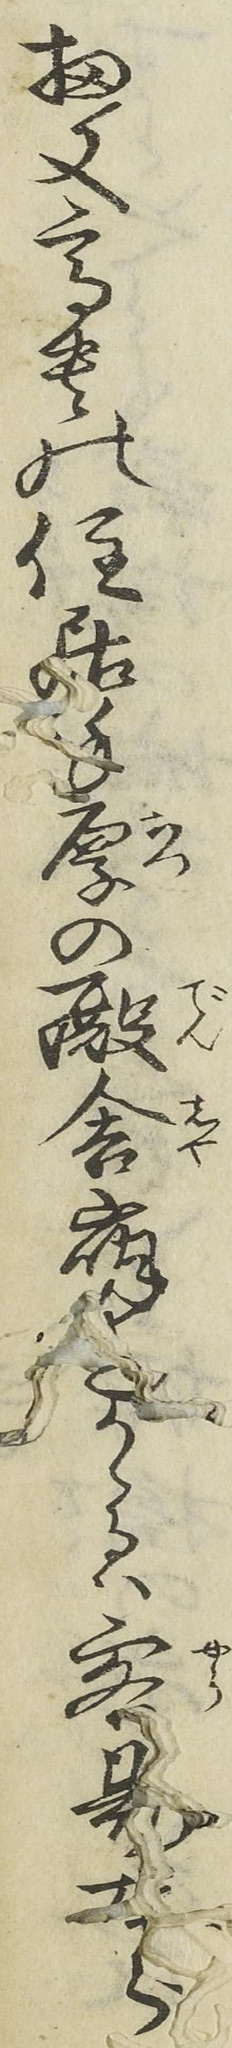物丈高きの住居手厚の殿舎崩れかゝるは容易なら

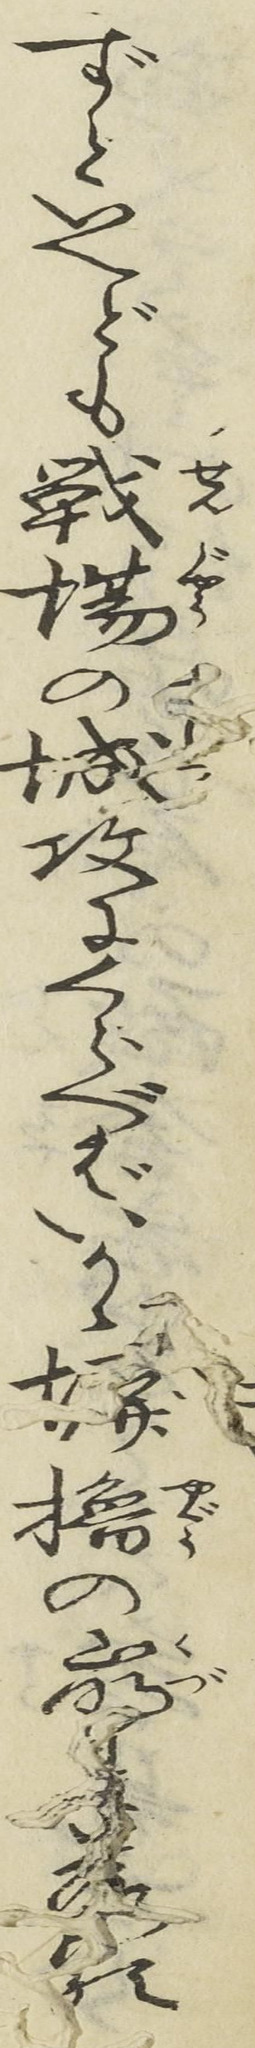ずといへども戦場の城攻にくらべばいかゝ塀櫓の崩落る
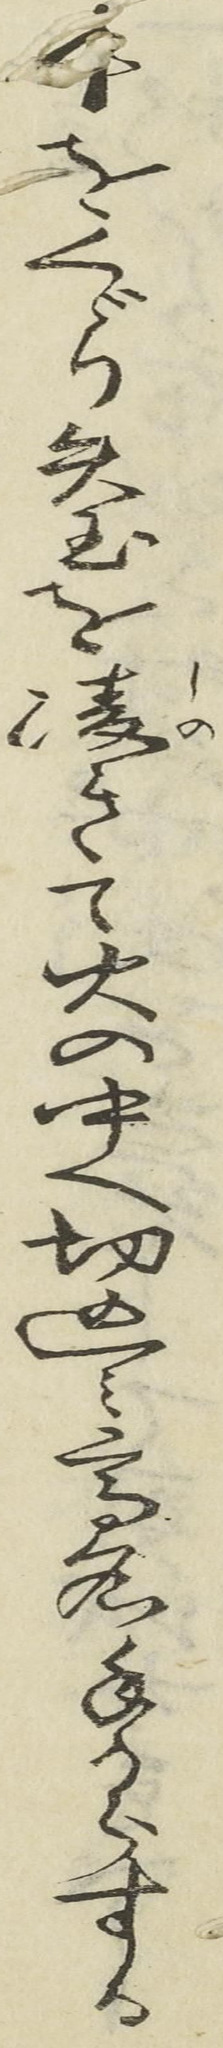をくゞり矢玉を凌きて火の中へ切込み高名手からする
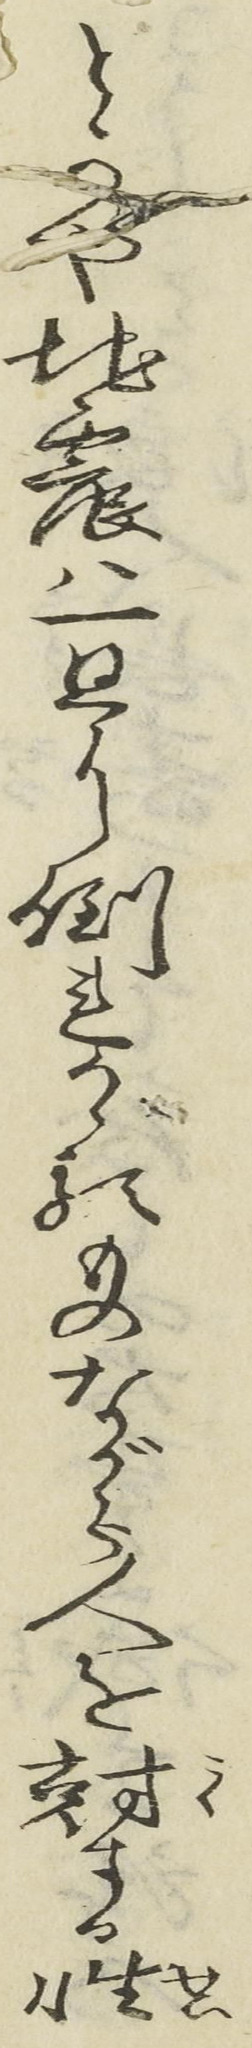とかや地震は一旦に倒れかゝるものながら人を尅する性
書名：震雷考説　全
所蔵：東京大学地震研究所図書室 Earthquake Research Institute Library, The University of Tokyo, JAPAN
